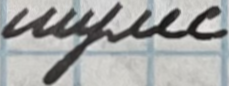тулес
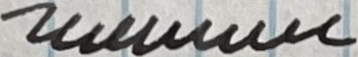чистик
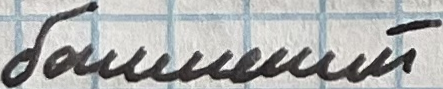бонинский
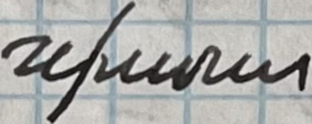черныш
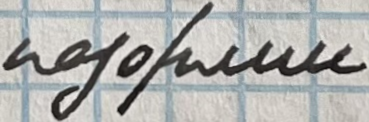подорлик
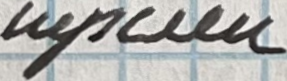пухляк
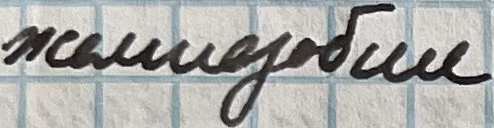желтозобик
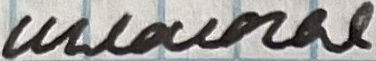иглоногая
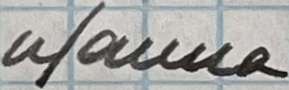крошка
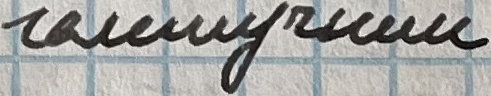галстучник
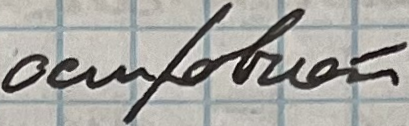островной
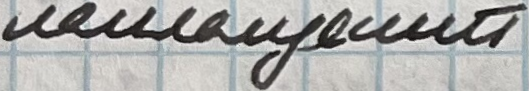лапландский
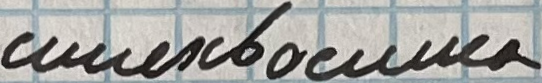синехвостка
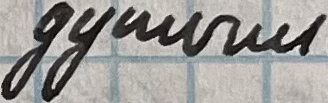дутыш
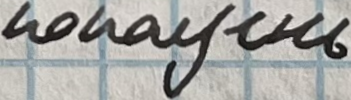поползень
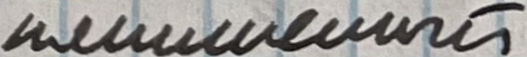пятнистый
